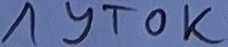луток
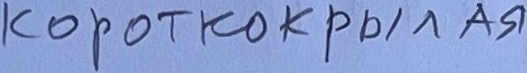короткокрылая
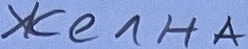желна
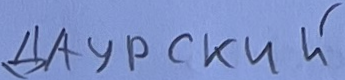даурский
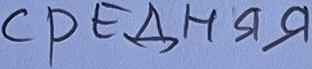средняя
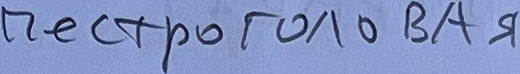пестроголовая
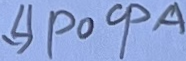дрофа
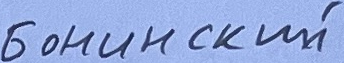бонинский
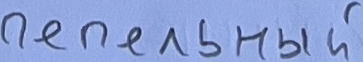пепельный
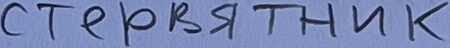стервятник
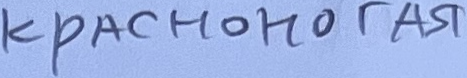красноногая
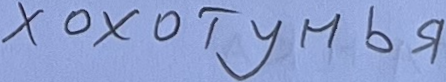хохотунья
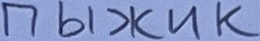пыжик
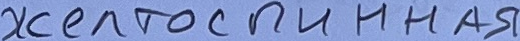желтоспинная
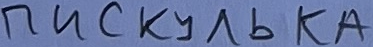пискулька
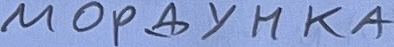мордунка
